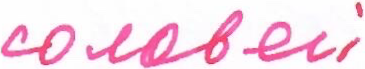соловей
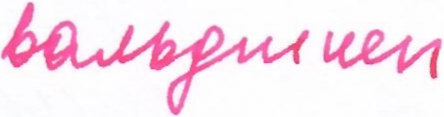вальдшнеп
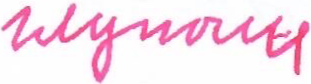глупыш
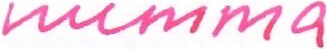питта
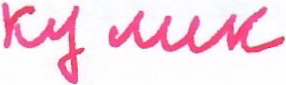ку лик
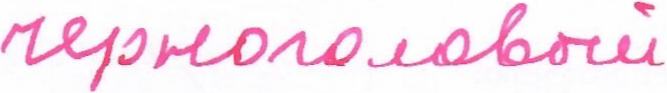черноголовый
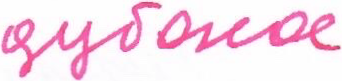дубонос
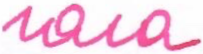гага
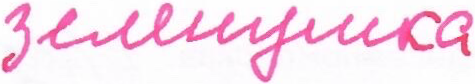зеленушка
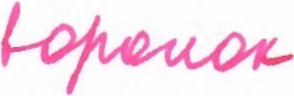воронок
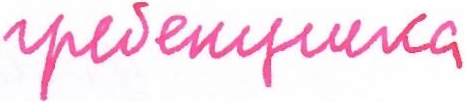гребенушка
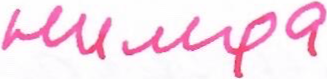нимфа
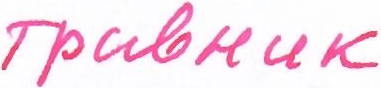травник
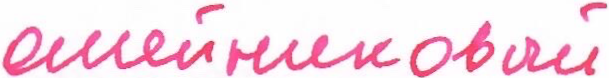ошейниковый
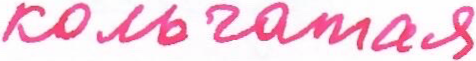кольчатая
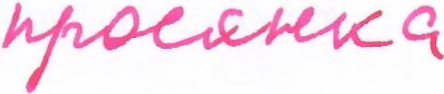просянка
